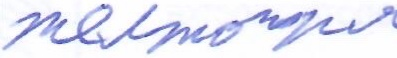желтотря
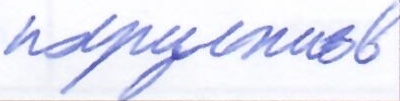парусниов
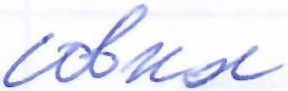совка
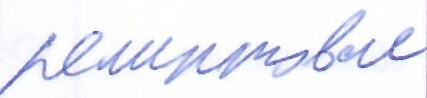реликтовая
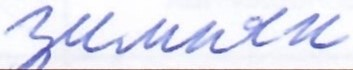зимняк
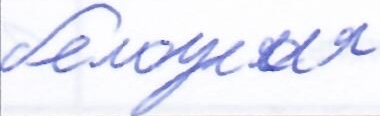белоусая
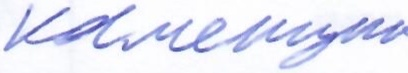каменуш
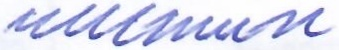чистик
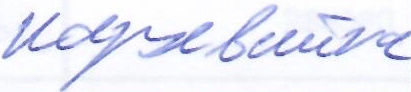каривийка
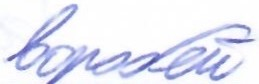воробей
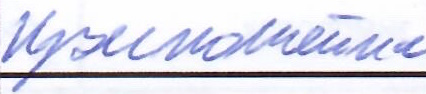красношейка
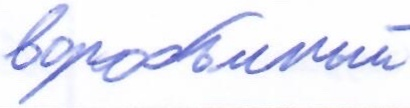воробьиный
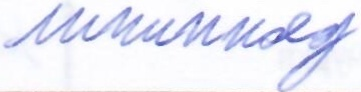личинкоед
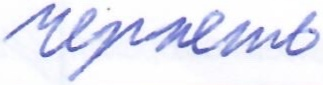чернеть
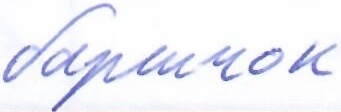барсичок
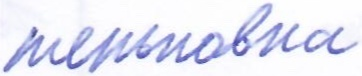теньковка
